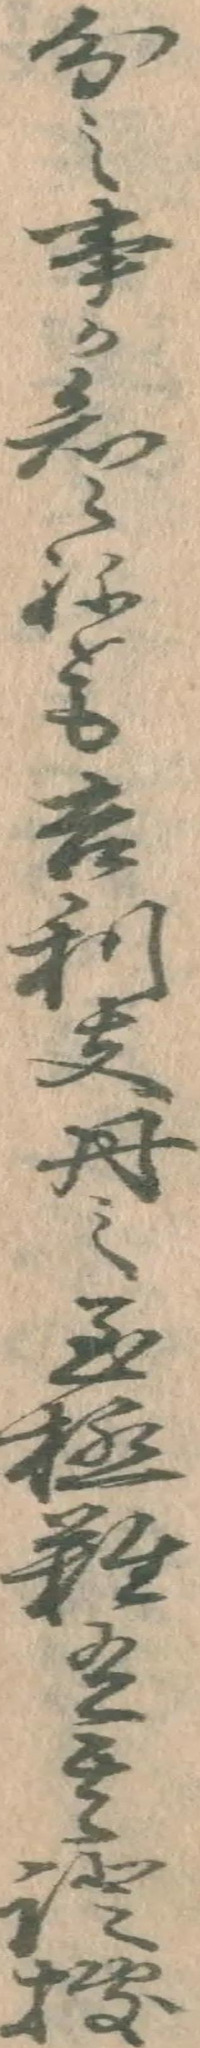分之事か知らねとも吉利支丹之至極難有其証拠
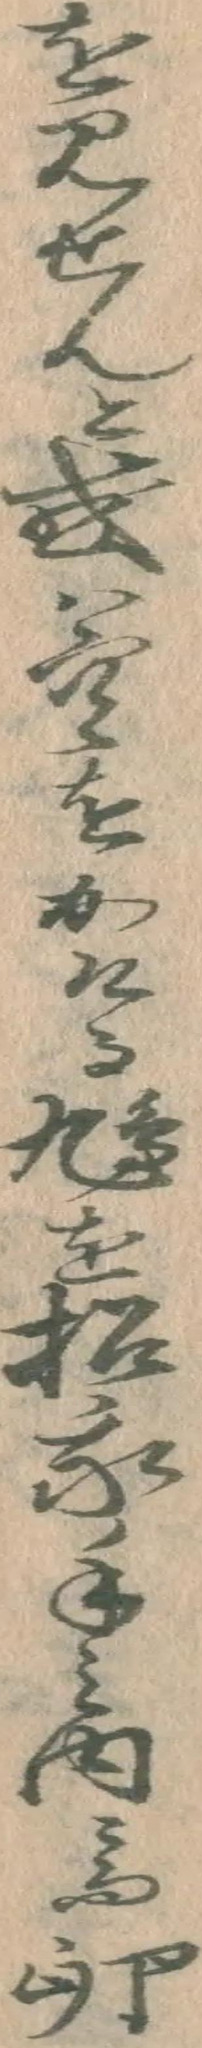を見せんと或は空をかける鳩を招我手之内に而卵
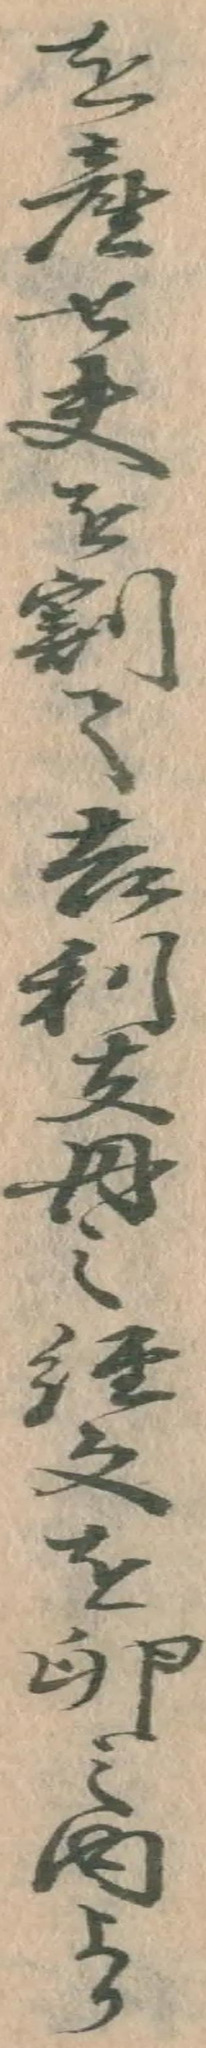を産せ夫を割て吉利支丹之経文を卵之内より
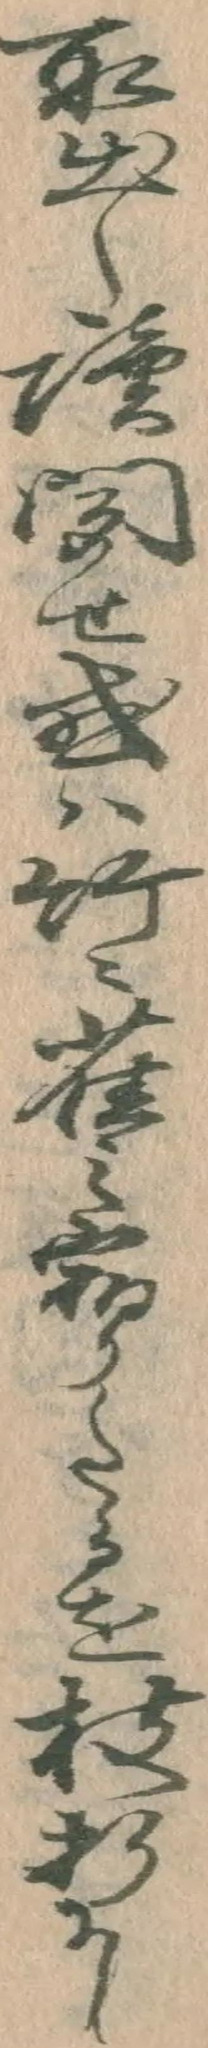取出し読聞せ或は竹に雀之宿りたるを枝折にし
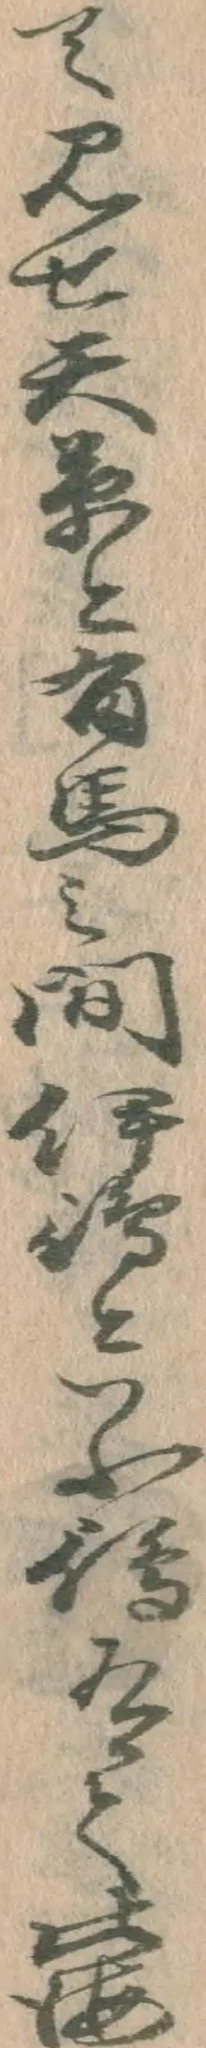て見せ天草と有馬之間伊島といふ島有て此海
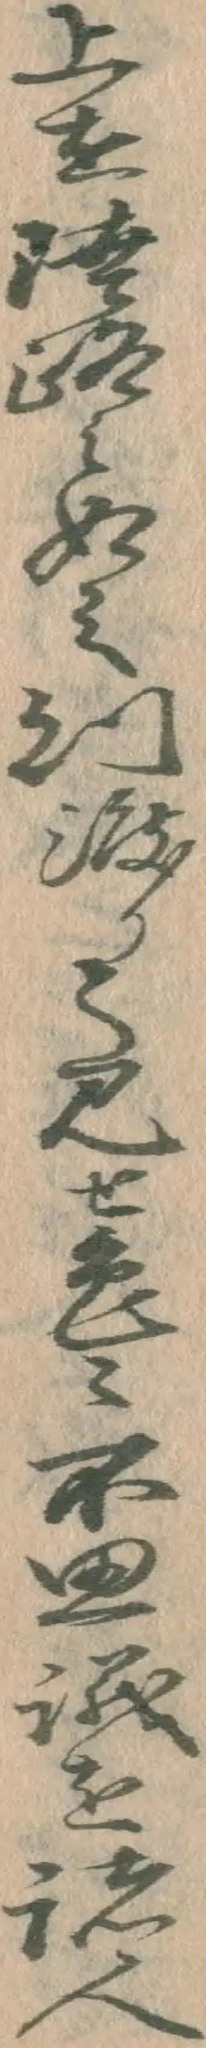上を陸路之如く則渡りて見せ色々不思議を諸人
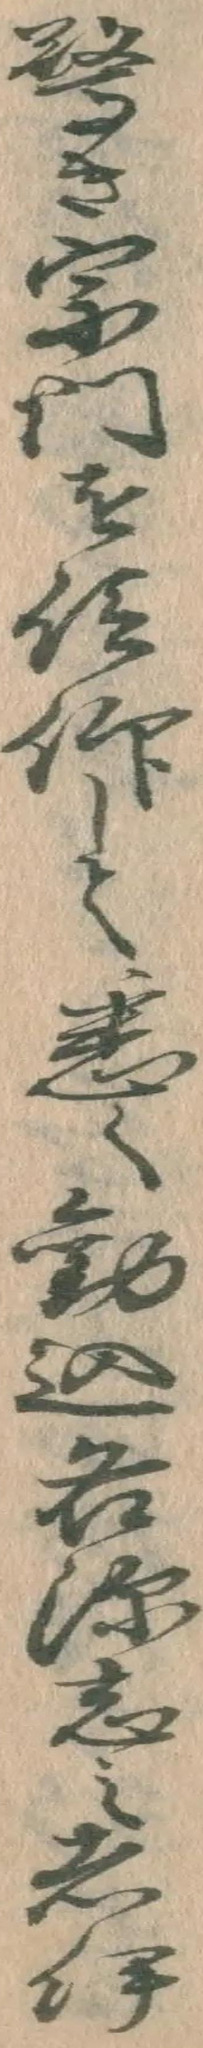驚き宗門を信仰して悉く勧込各深志之者伊
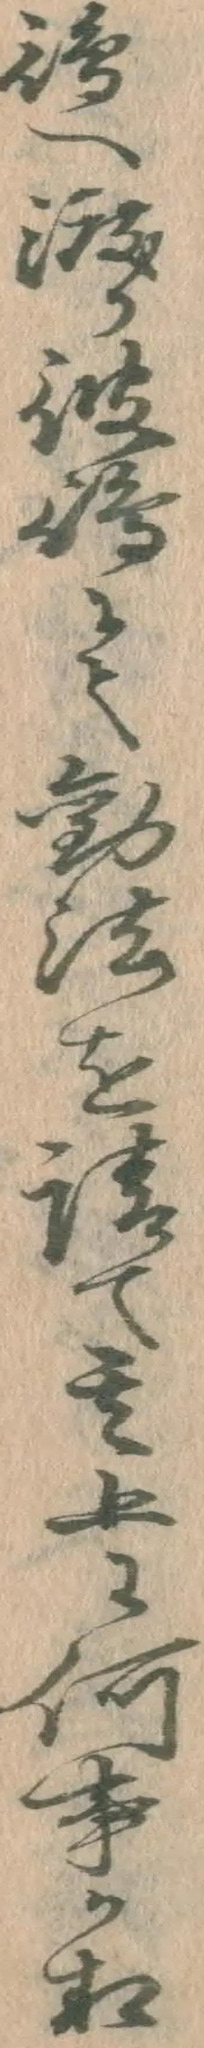島へ渡り彼島にて勧法を請て其上に何事か相
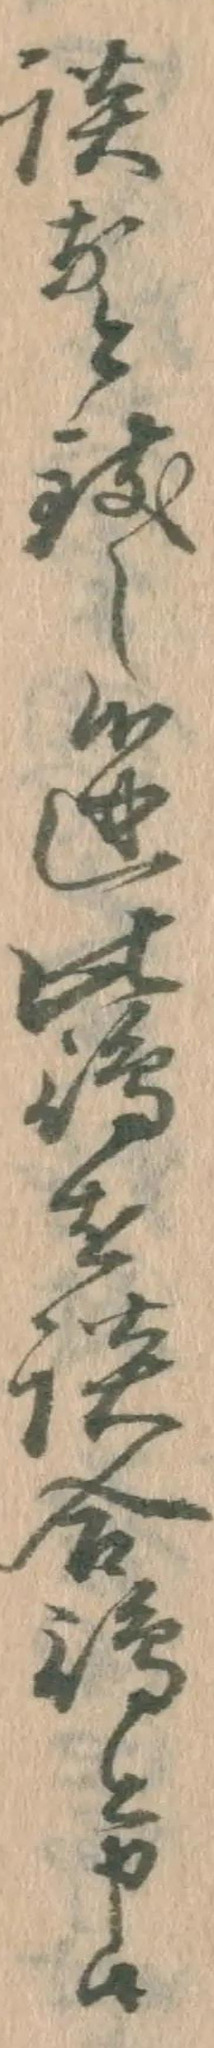談なと致し候迚此島を談合島と申候
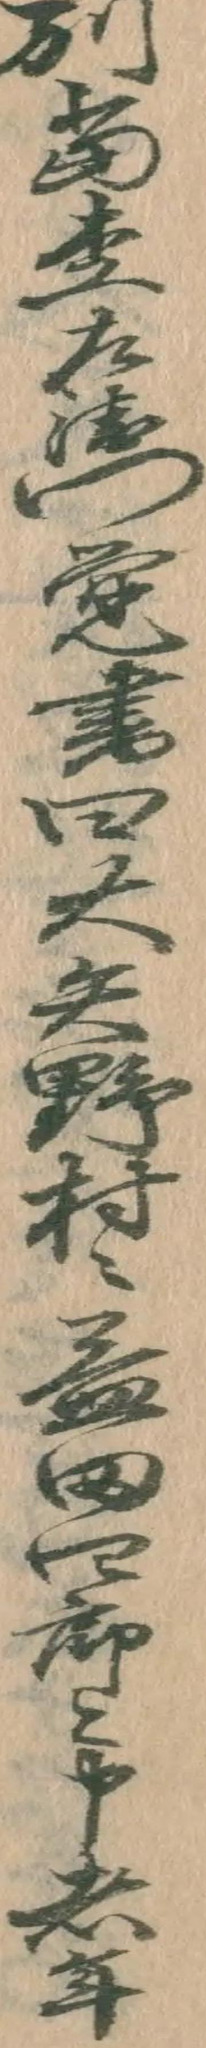別当杢左衛門覚書日大矢野村に益田四郎と申者年
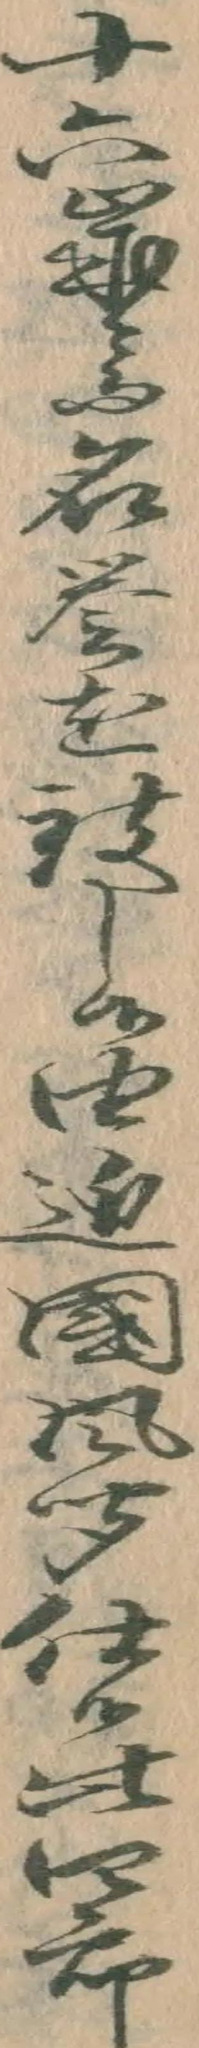十六歳に而名誉を致し候由近国風聞仕候此四郎
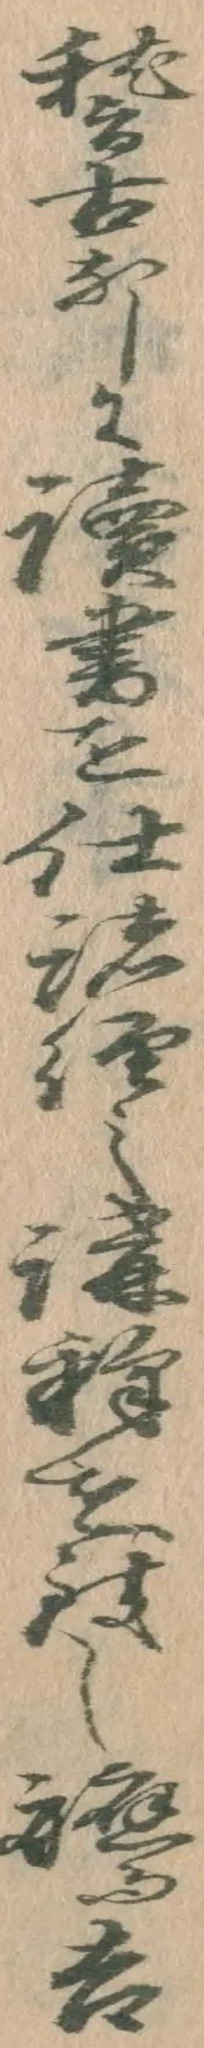稽古なしに読書を仕諸経之講釈を致し軈而吉
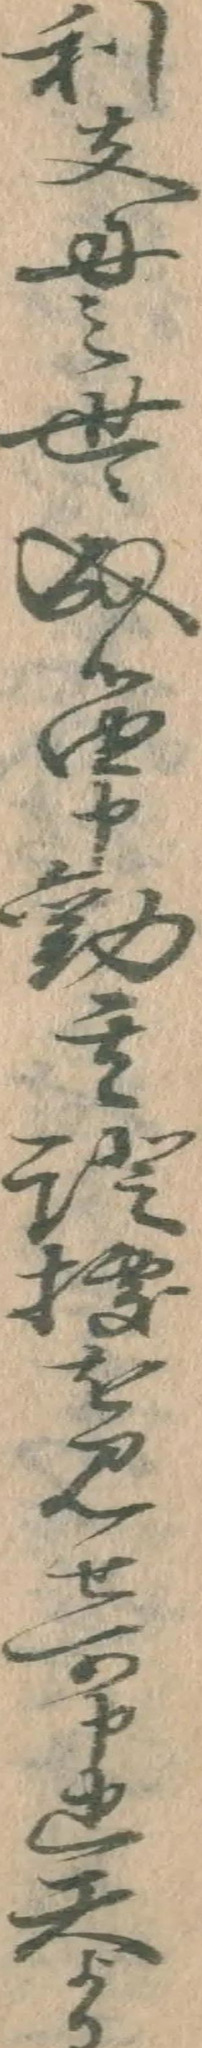利支丹之世に成候由申勧其証拠を見せ可申迚天より
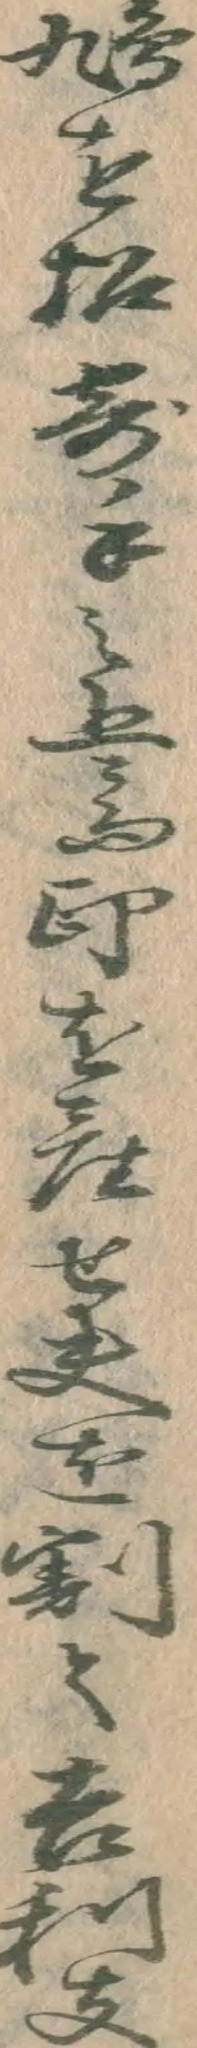鳩を招寄手之上に而卵を産せ夫を割て吉利支
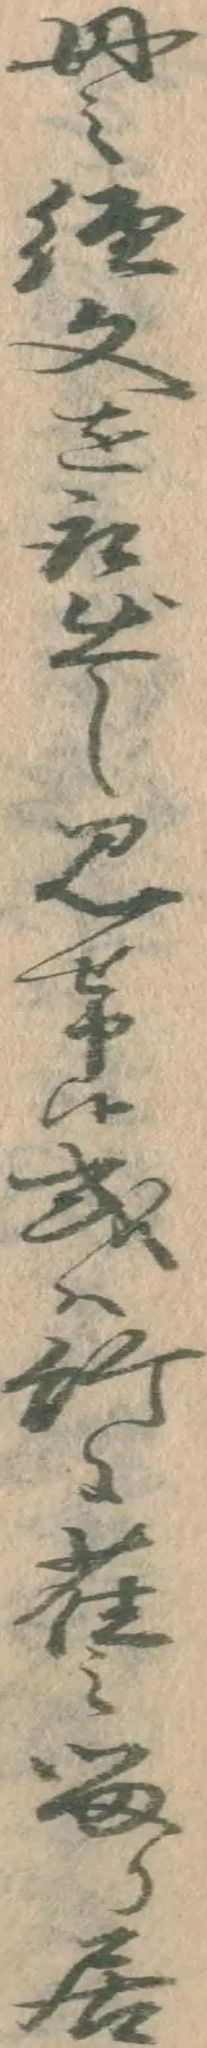丹之経文を取出し見せ申候或は竹に雀之留り居
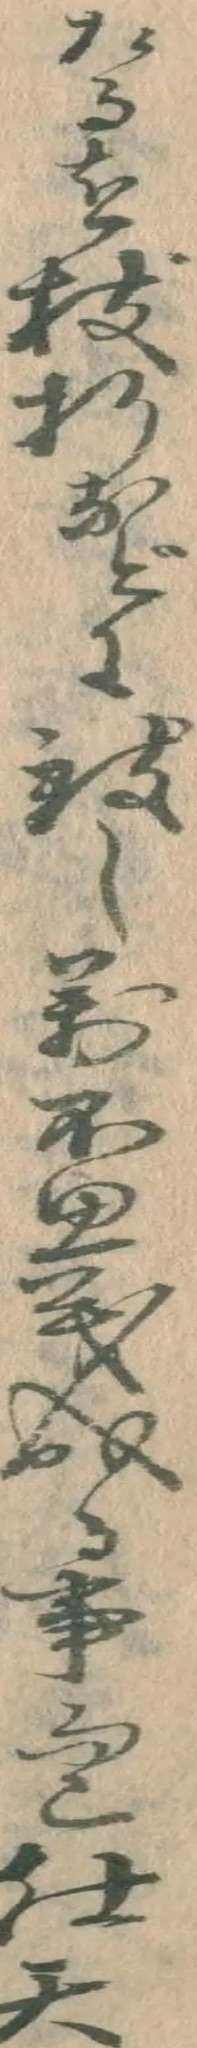たるを枝折などに致し万不思義成る事而已仕天
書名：切支丹御退治記 49巻. [1]
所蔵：国立国会図書館 National Diet Library, JAPAN
